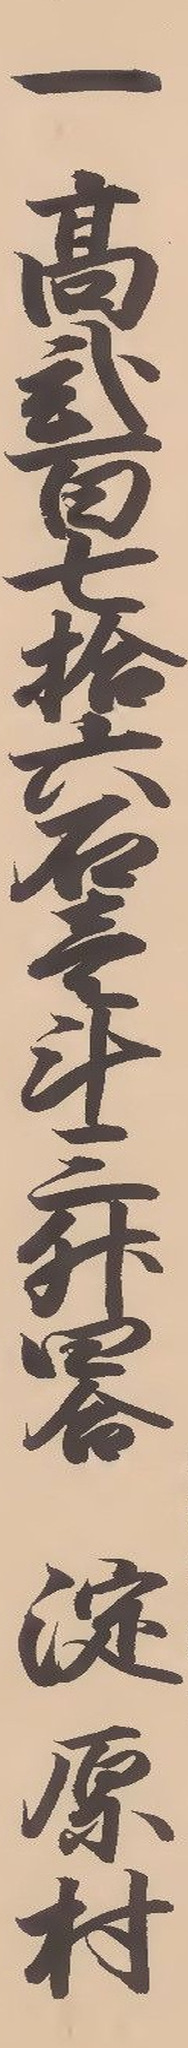一髙弐百七拾六石壱斗三升四合淀原村
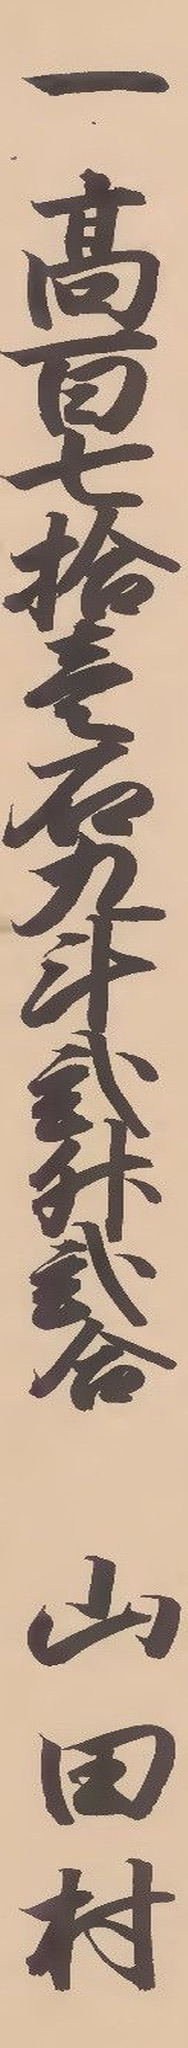一髙百七拾壱石九斗弐升弐合山田村
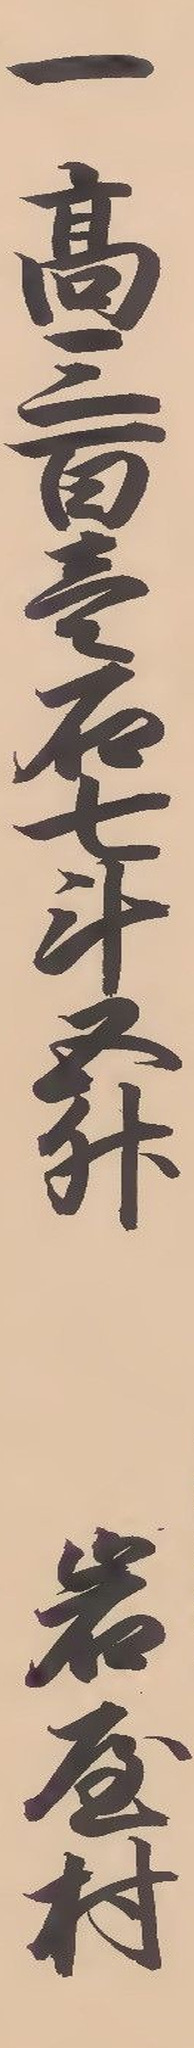一髙三百壱石七斗五升岩屋村

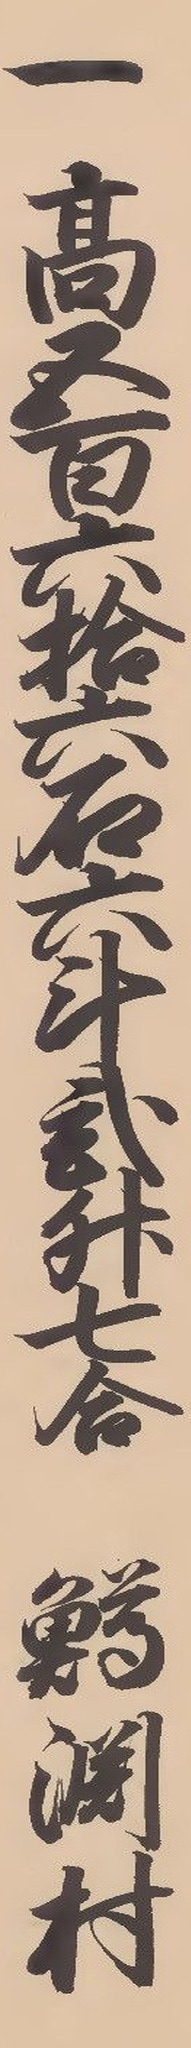一髙五百六拾六石六斗弐升七合鱒淵村
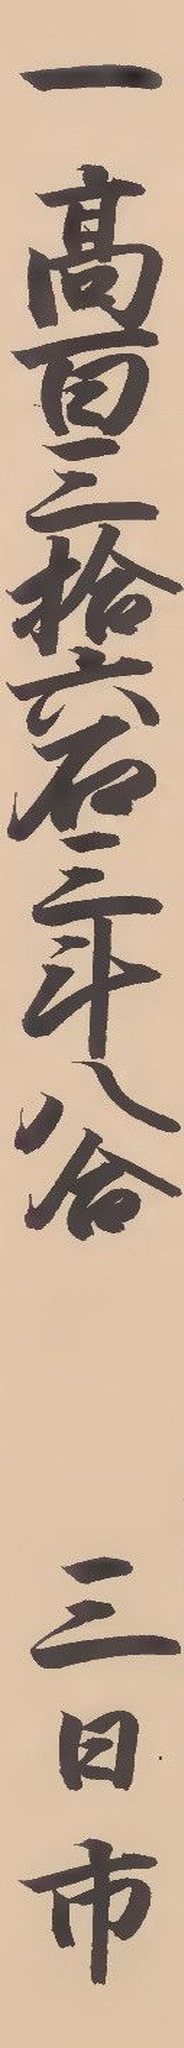一髙百三拾六石三斗八合三日市
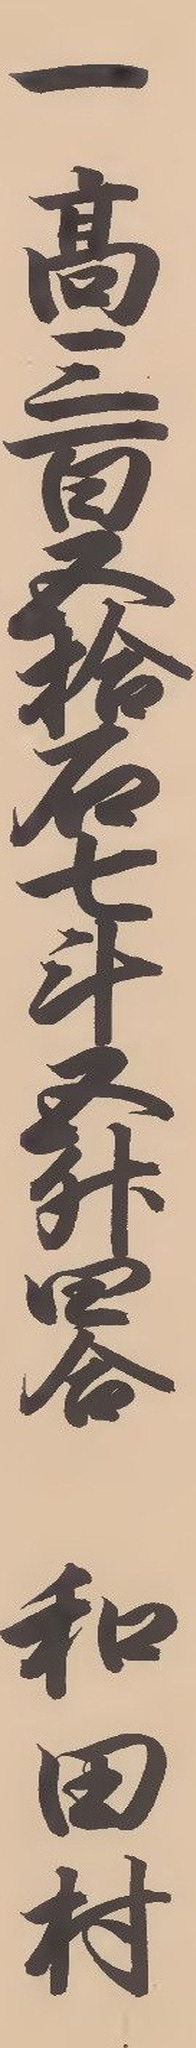一髙三百五拾石七斗五升四合和田村
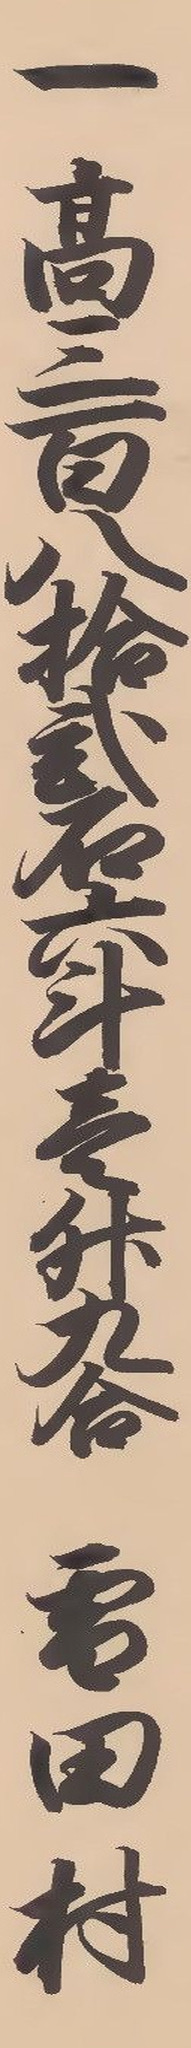一髙三百八拾弐石六斗壱升九合雪田村
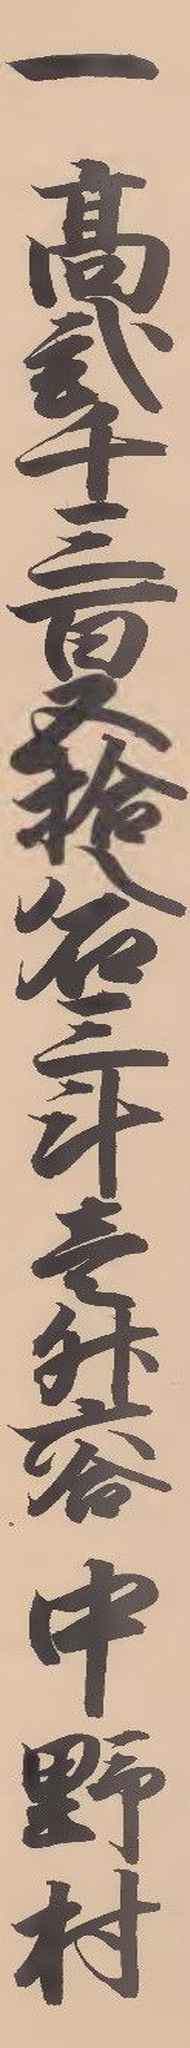一髙弐千三百五拾八石三斗壱升六合中野村
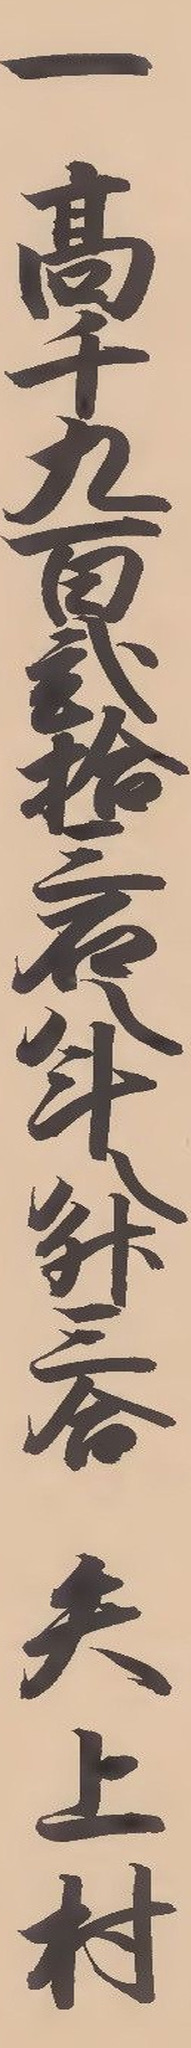一髙千九百弐拾三石八斗八升三合矢上村
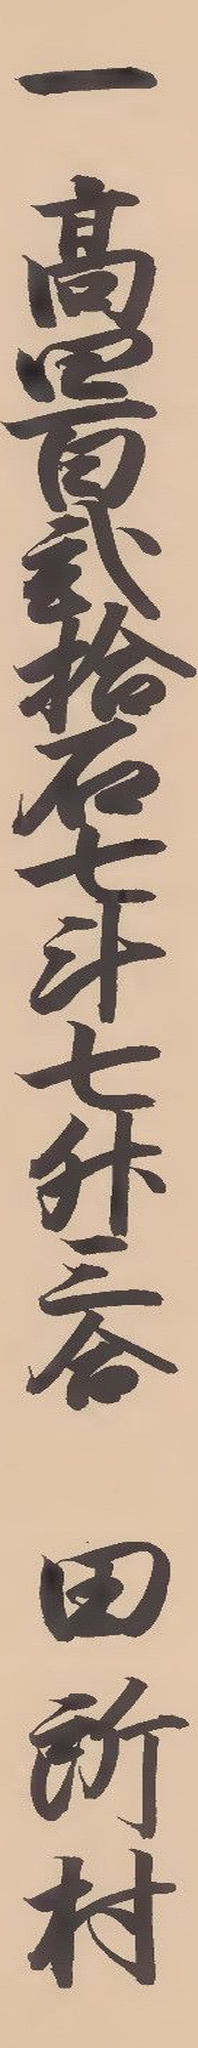一髙四百弐拾石七斗七升三合田所村
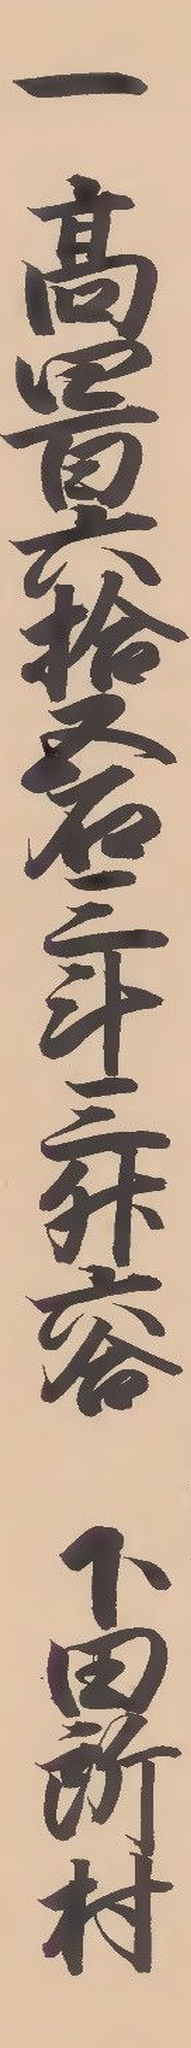一髙四百六拾五石三斗三升六合下田所村

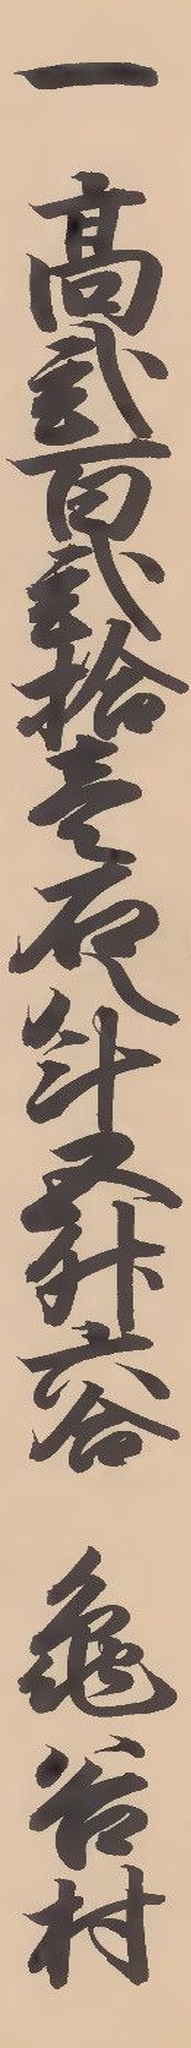一髙弐百弐拾壱石八斗五升六合龜谷村
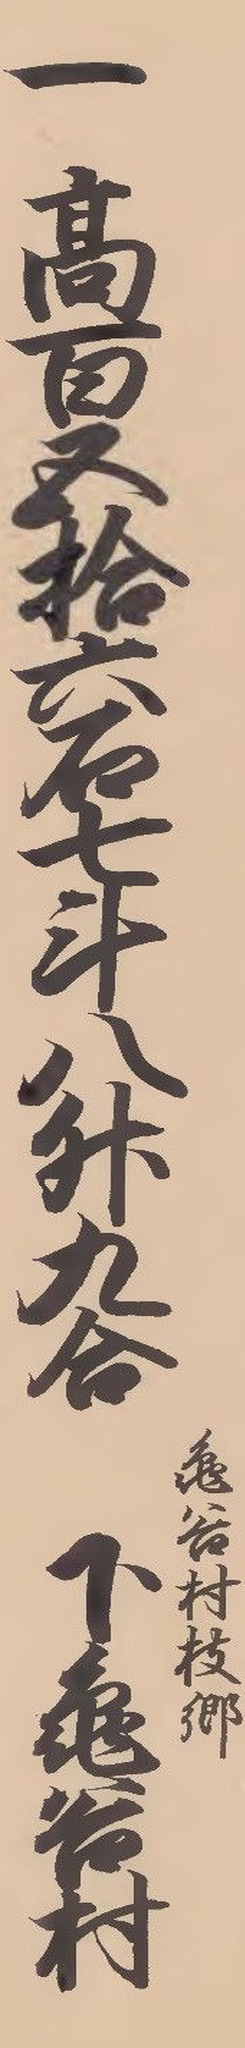一髙百五拾六石七斗八升九合下龜谷村
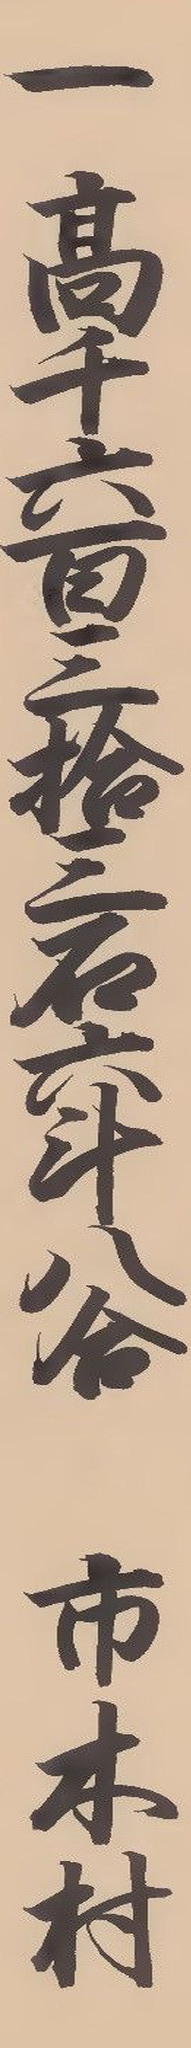一髙千六百三拾三石六斗八合市木村
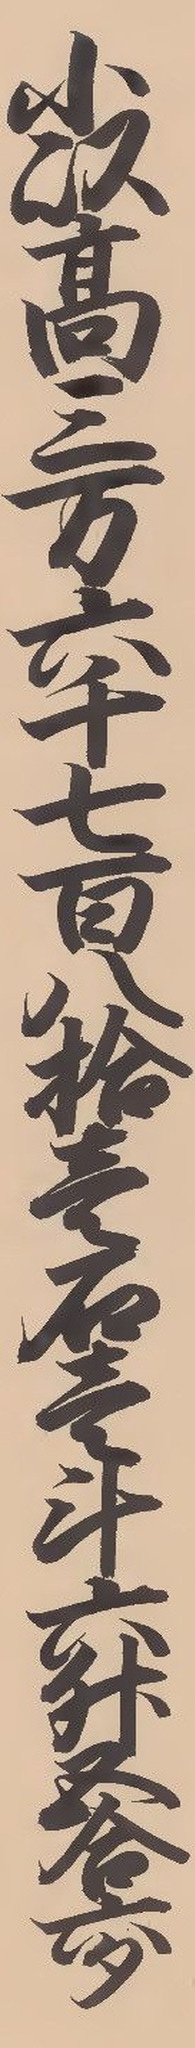小以髙三万六千七百八拾壱石壱斗六升五合六夕

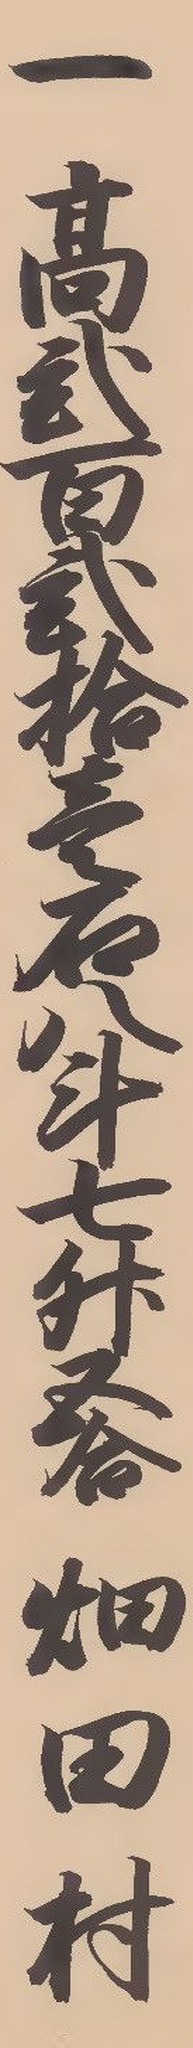一髙弐百弐拾壱石八斗七升五合畑田村
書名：石見国郷帳
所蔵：国立公文書館 National Archives of Japan
